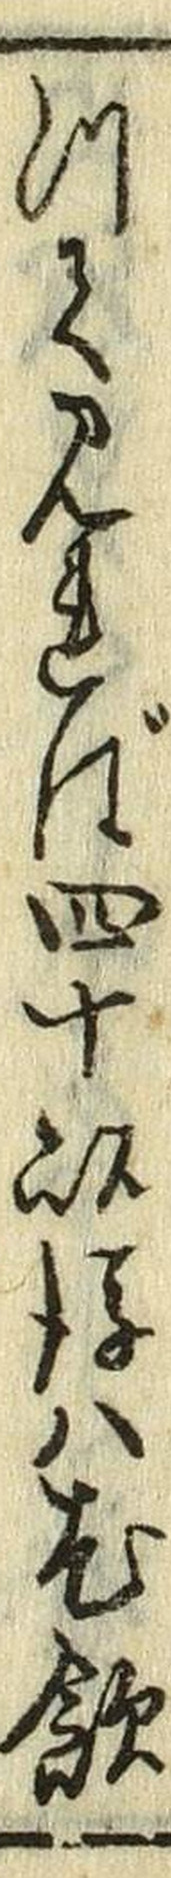つて見れば四十以後は尤飲
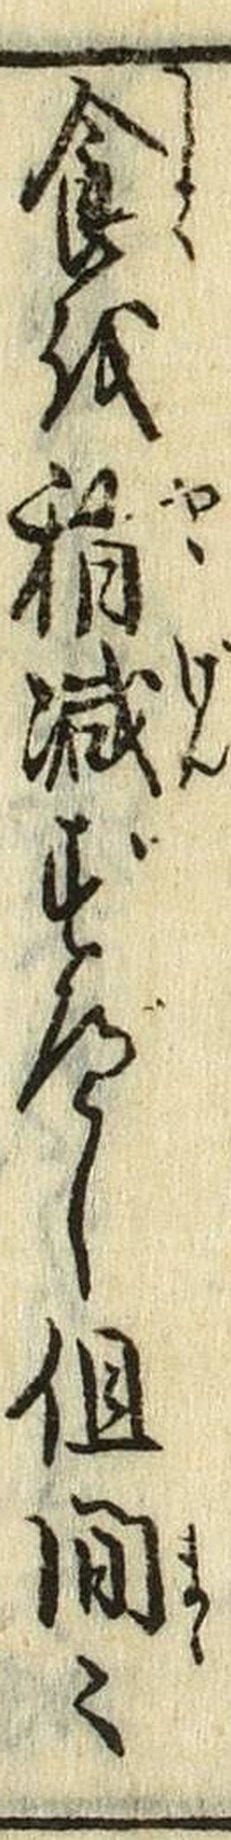食を稍減ずべし但間々
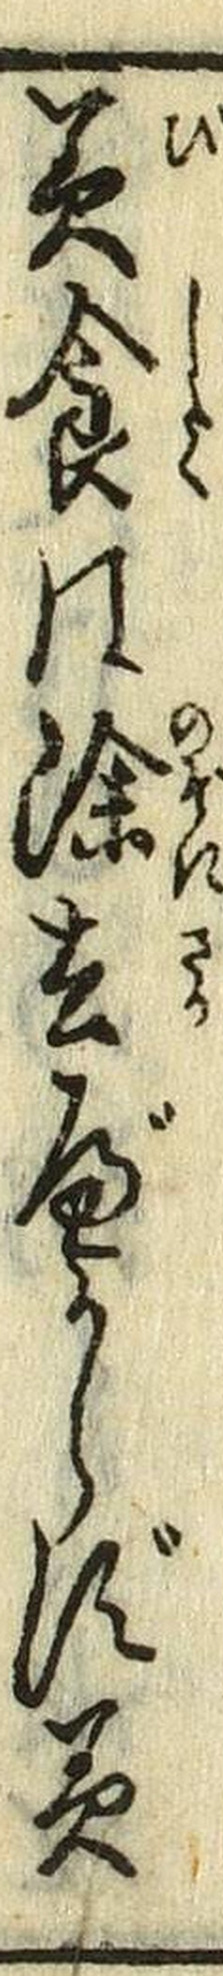美食は除去べからず美
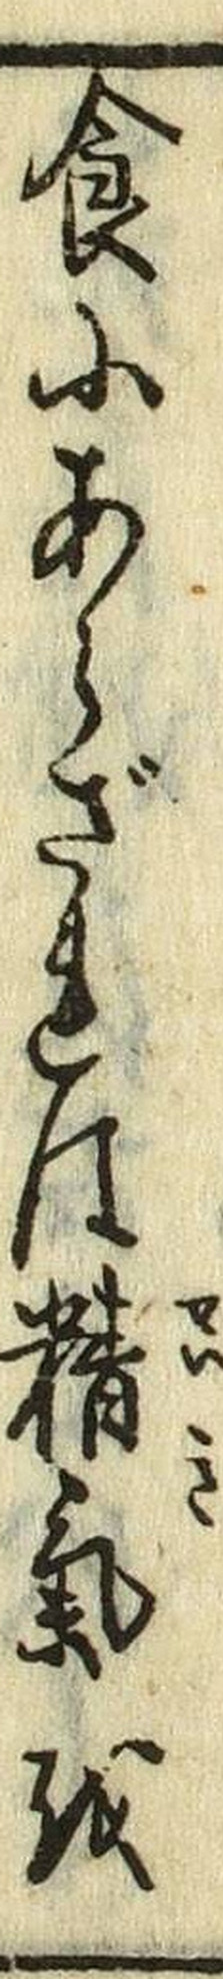食にあらざれは精気を
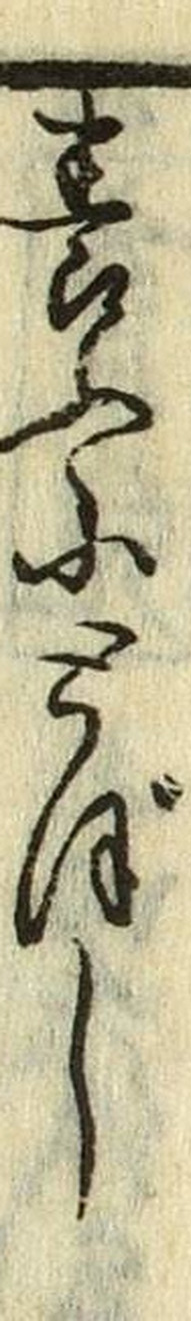養ふにとぼし
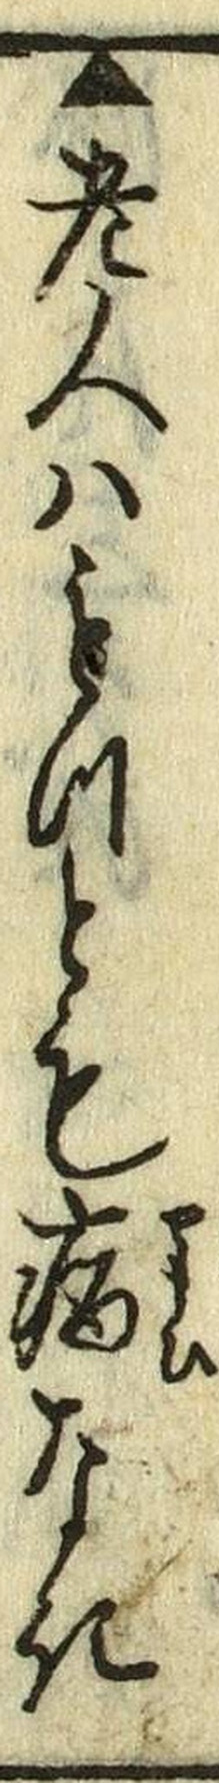▲老人はもつとも病なき
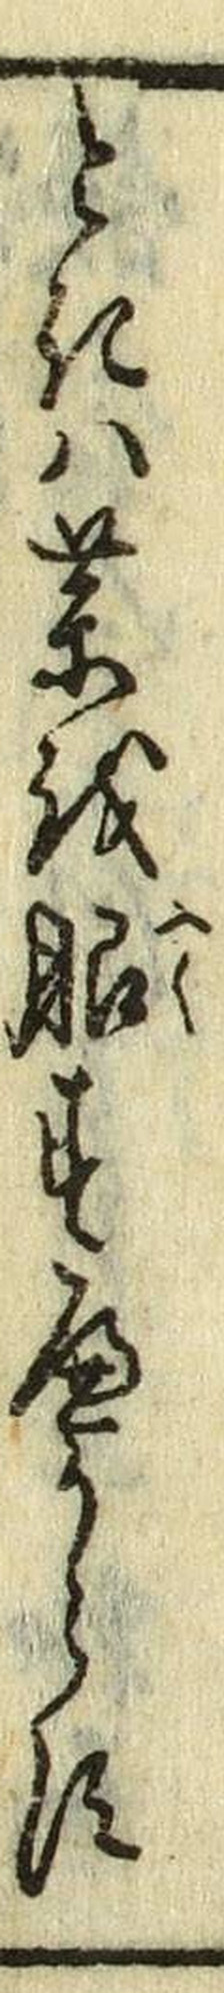ときは薬を服すへからす
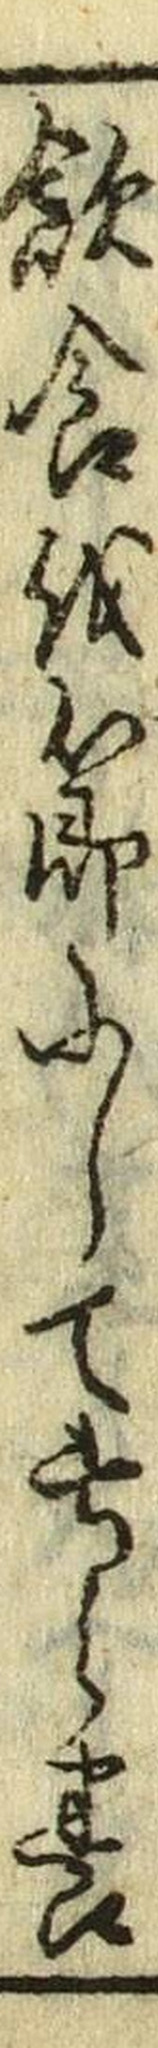飲食を節にして専ら養

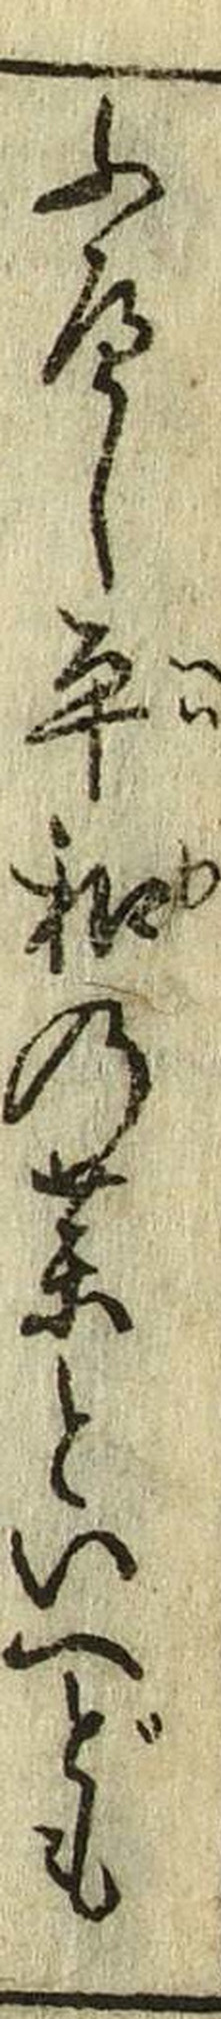ふへし平和の薬といへども
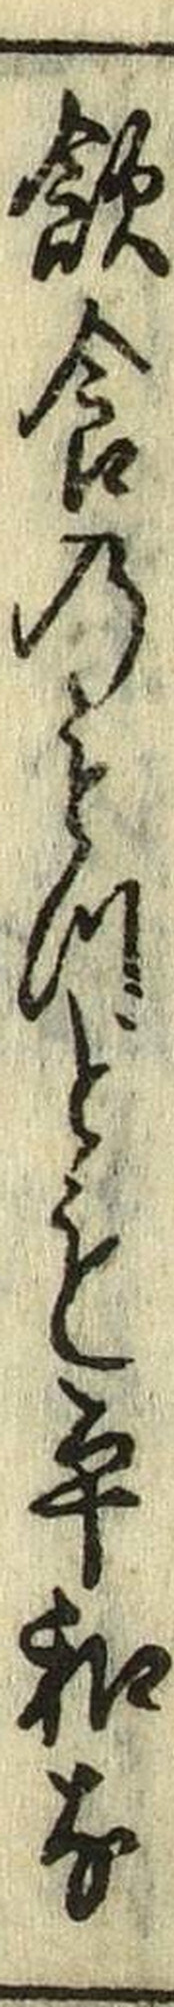飲食のもつとも平和な
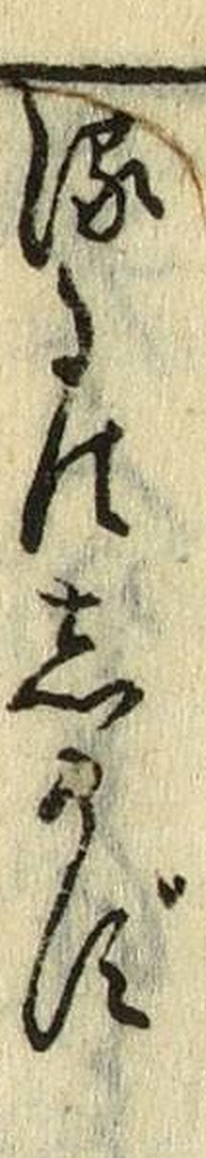るにはしかず
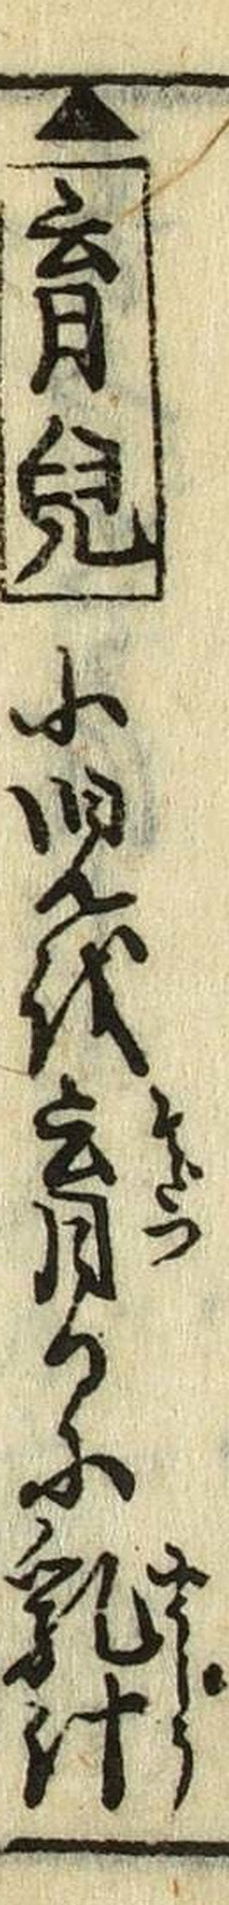▲育児小児を育るに乳汁
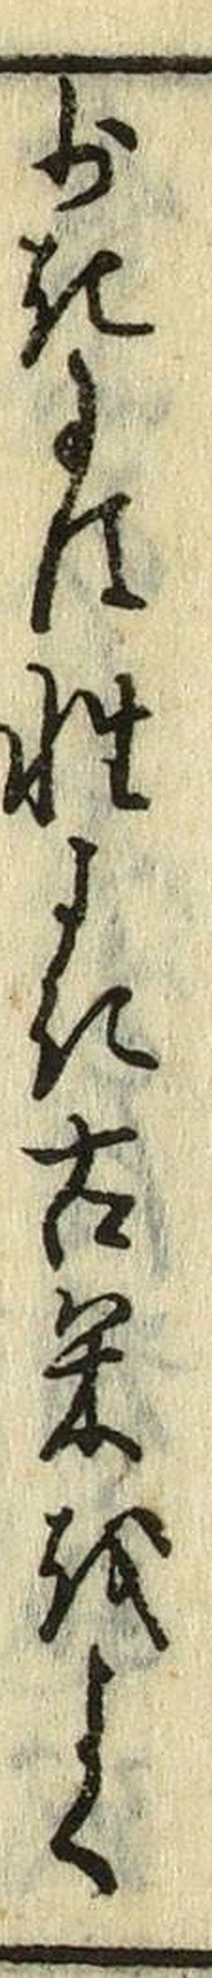少きには性よき古米をよく
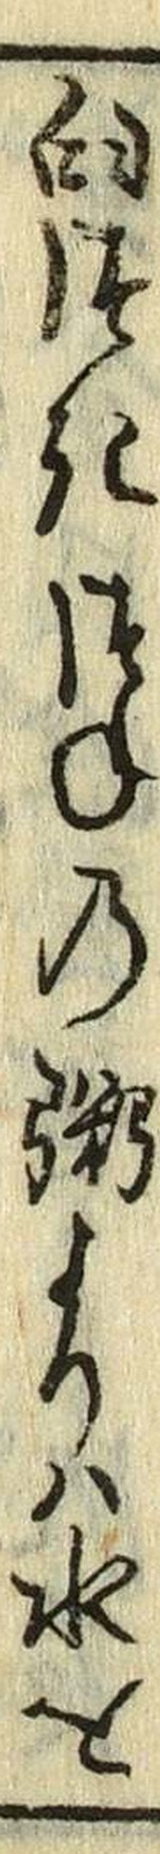臼つきつねの粥よりは水を
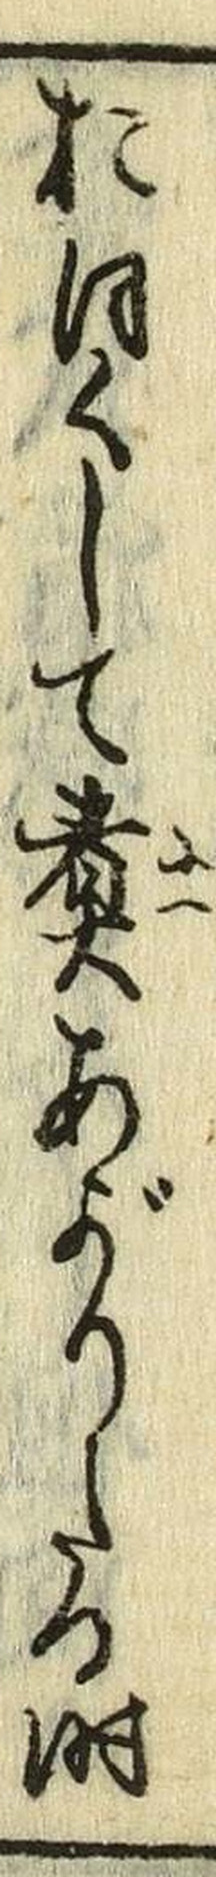おほくして煑あがりたる時
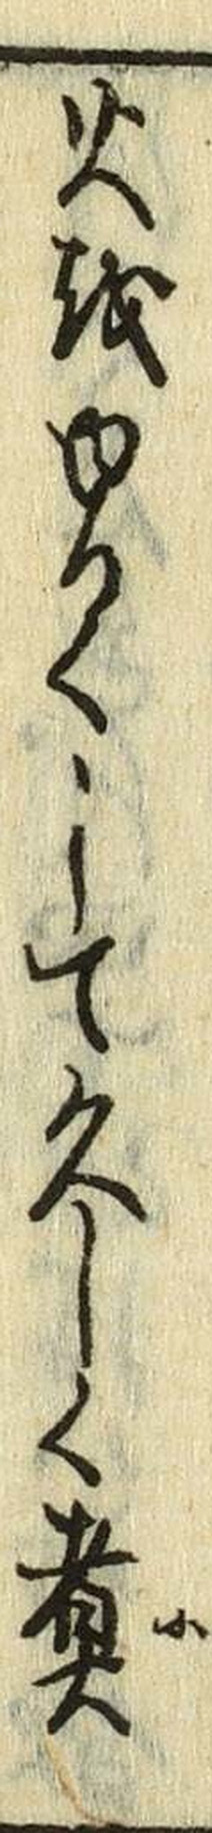火をゆるくして久しく煑
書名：居家養生記
